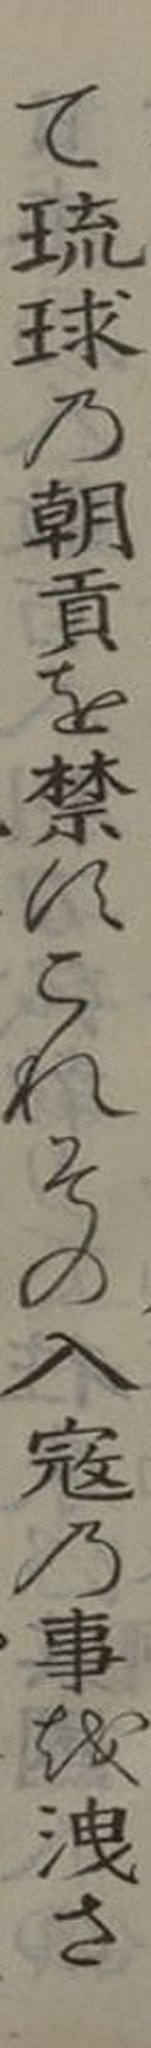て琉球の朝貢を禁すこれその入寇の事を漏さ
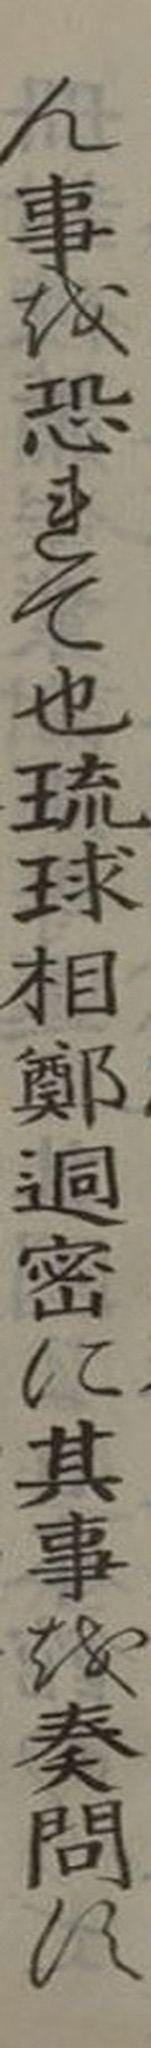ん事を恐れて也琉球相鄭迵密に其事を奏問す
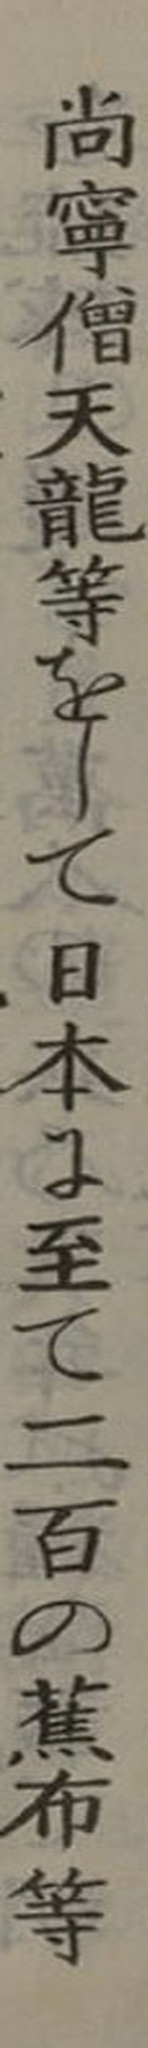尚寧僧天龍等をして日本に至て二百の蕉布等
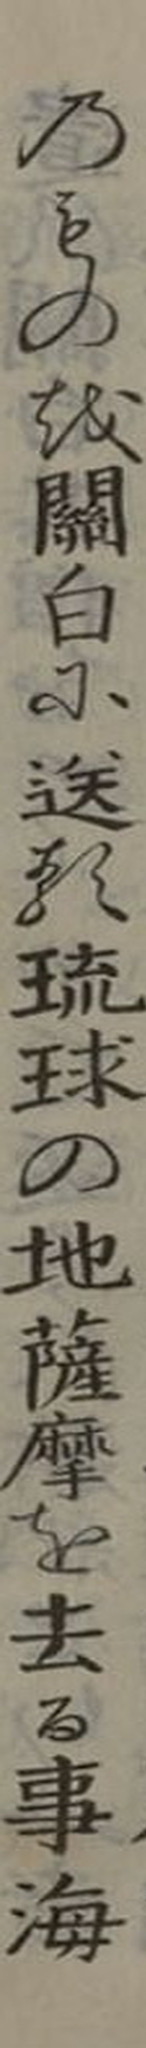のものを關白に送る琉球の地薩摩を去る事海
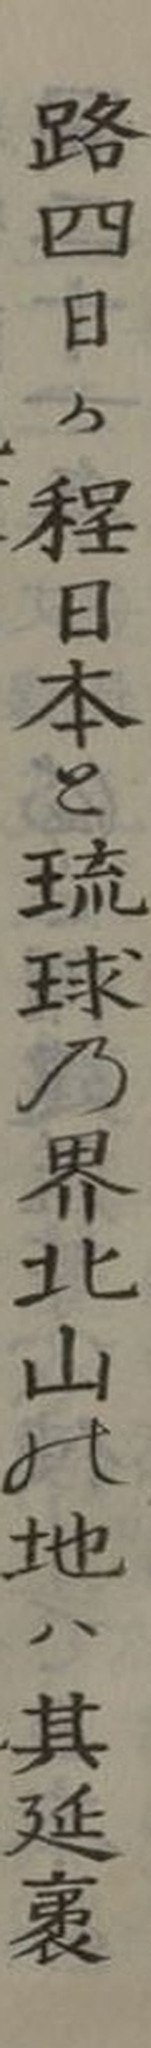路四日か程日本と琉球の界北山の地は其延袤
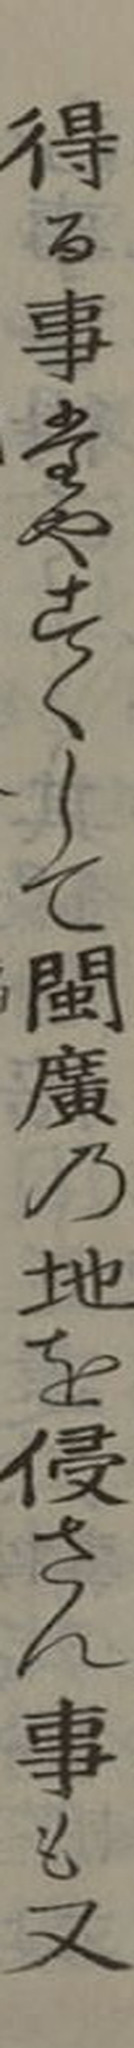得る事たやすくして閩廣の地を侵さん事も又
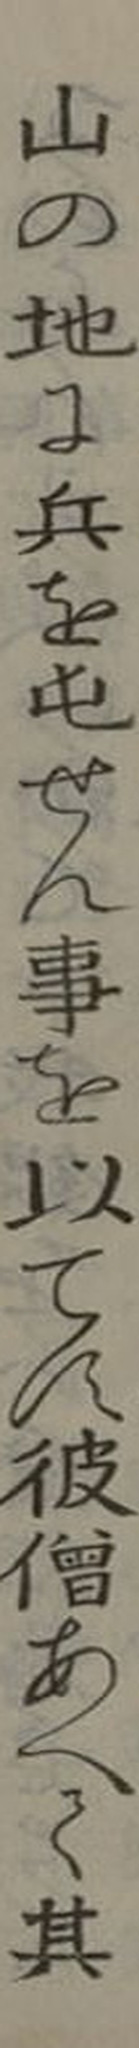山の地に兵を屯せん事を以てす彼僧あへて其
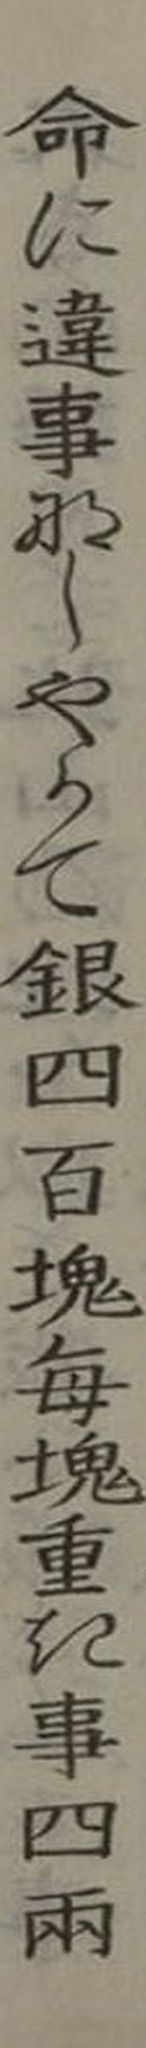命に違事なしやかて銀四百塊毎塊重き事四兩

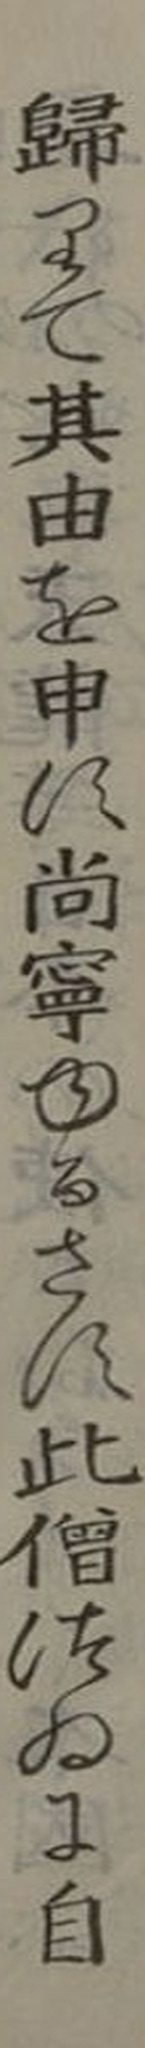歸りて其由を申す尚寧ゆるさす此僧つゐに自
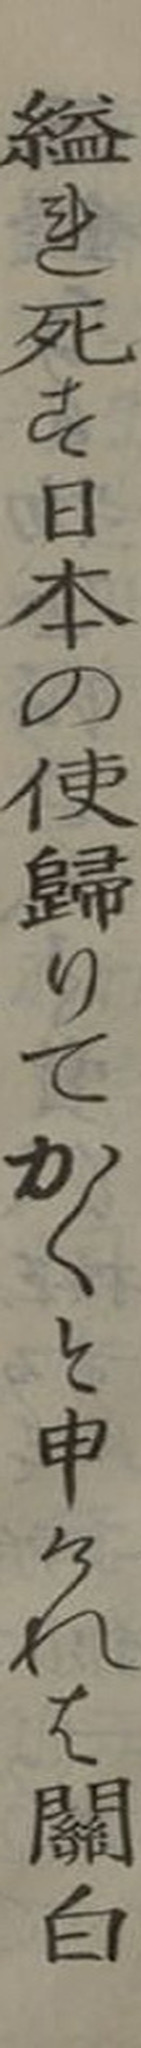縊れ死す日本の使歸りてかくと申けれは關白
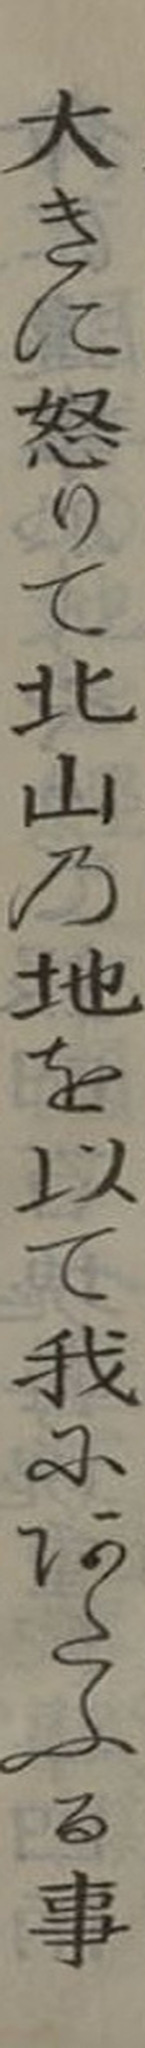大きに怒りて北山の地を以て我にあたふる事
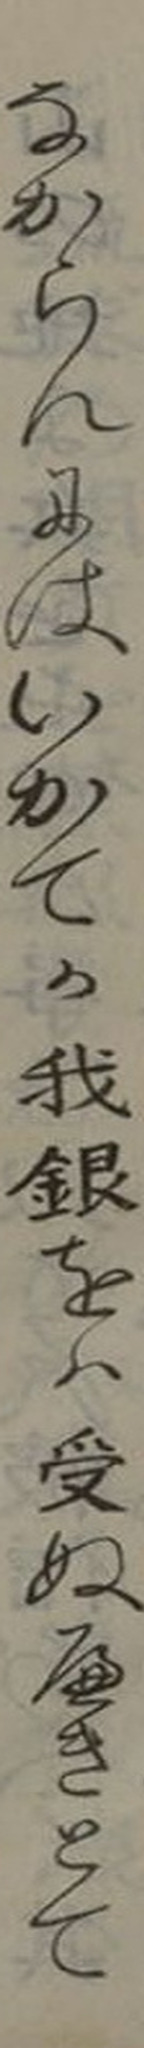なからんにはいかてか我銀をは受ぬへきとて
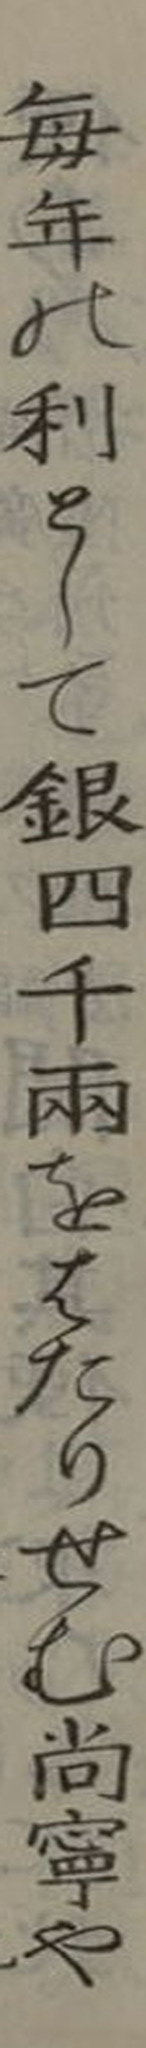毎年の利として銀四千兩をはたりせむ尚寧や
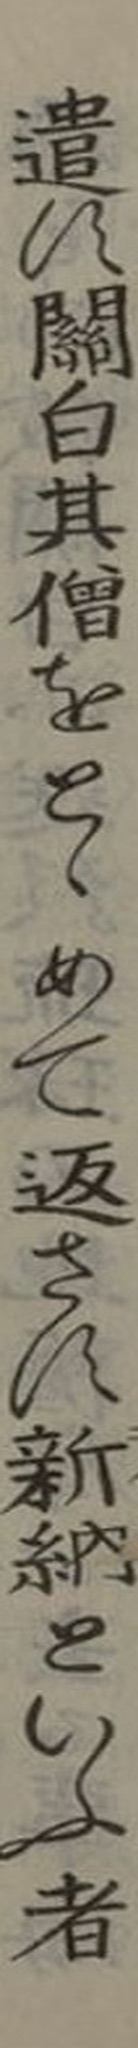遣す關白其僧をとゝめて返さす新納といふ者
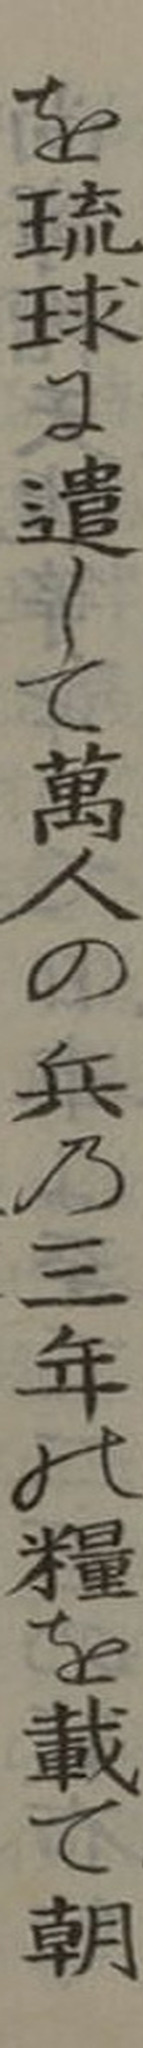を琉球に遣して萬人の兵の三年の糧を載て朝
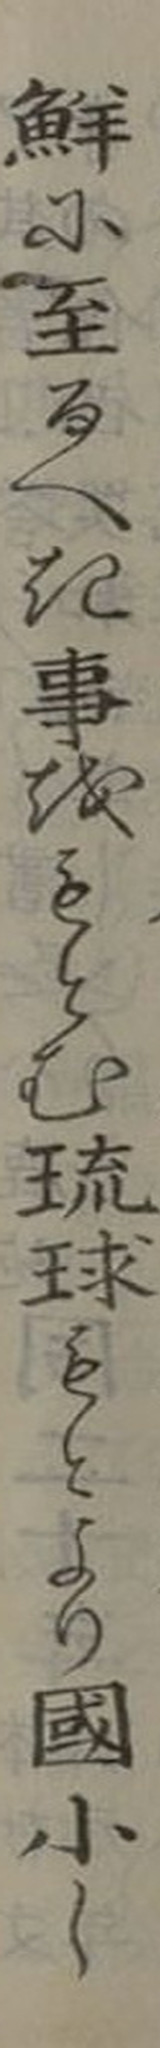鮮に至るへき事をもとむ琉球もとより國小し
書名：骨董録
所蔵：University of the Ryukyus Library
